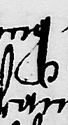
le.
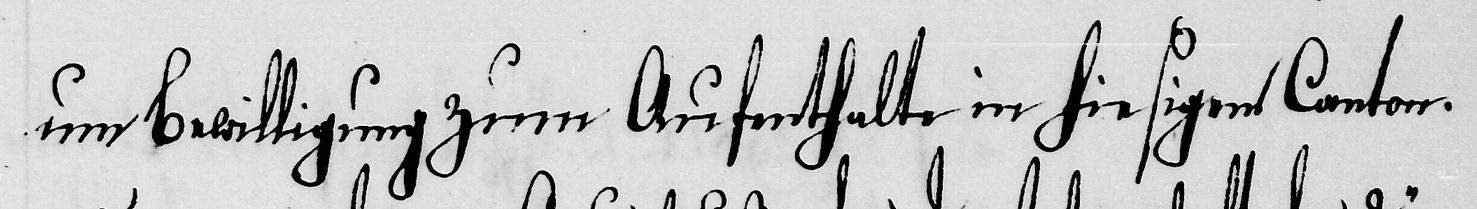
um Bewilligung zum Aufenthalte im hiesigen Canton.
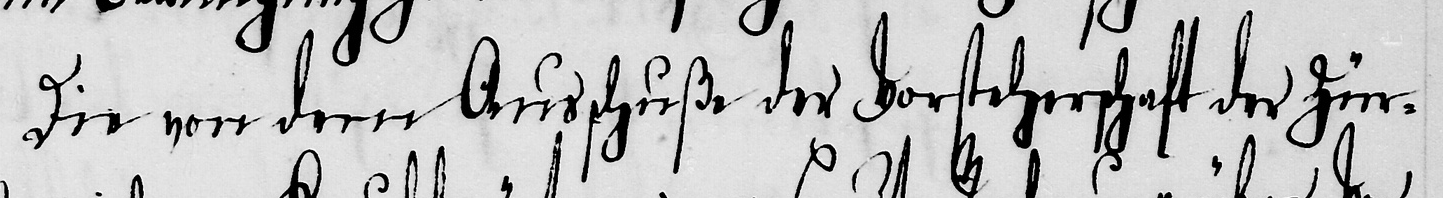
Die von dem Ausschuße der Vorsteherschaft der Zür¬
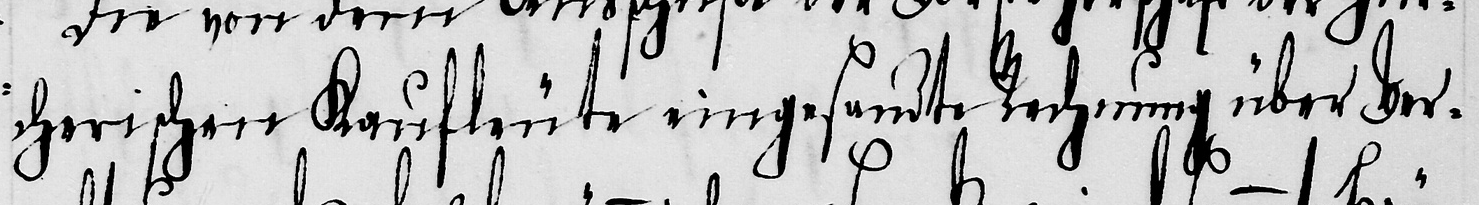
cherischen Kaufleute eingesandte Rechnung über Ver¬
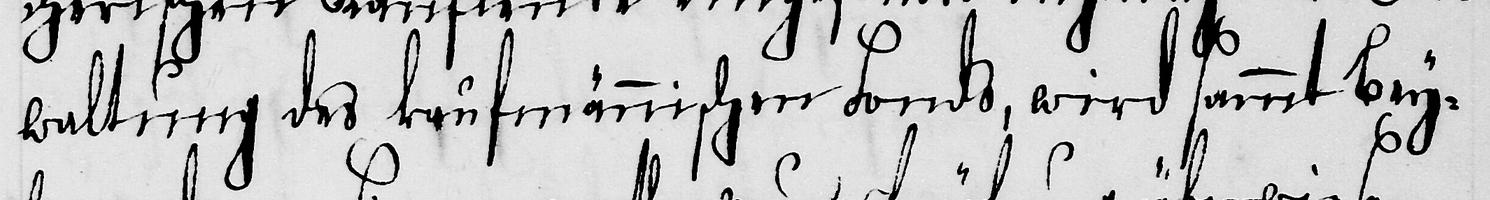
waltung des kaufmännischen Fonds, wird sammt Bey¬
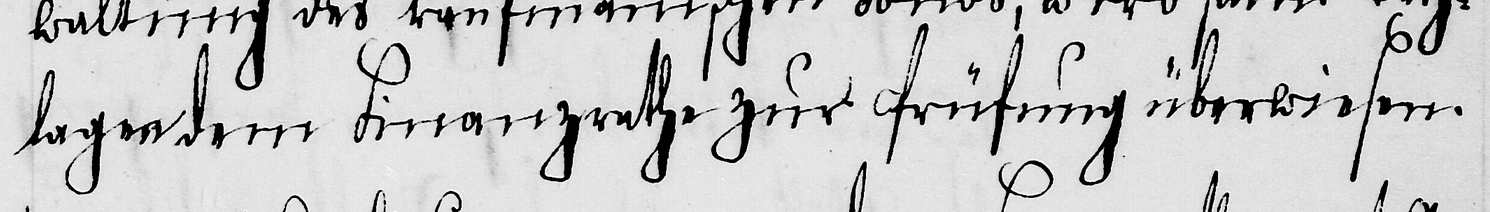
lagen dem Finanzrathe zur Prüfung überwiesen.
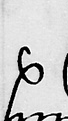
s,
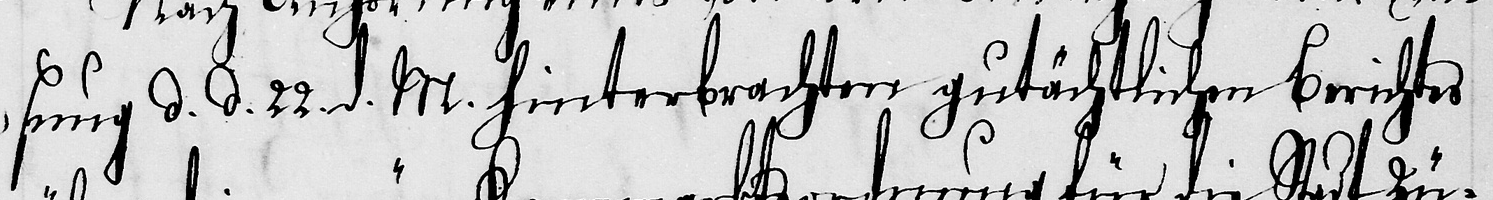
sung d. d. 22. d. M. hinterbrachten gutächtlichen Berichtes
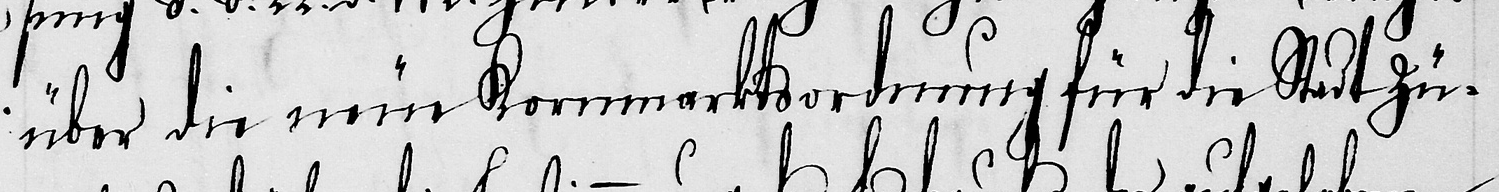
über die neue Kornmarktsordnung für die Stadt Zü¬
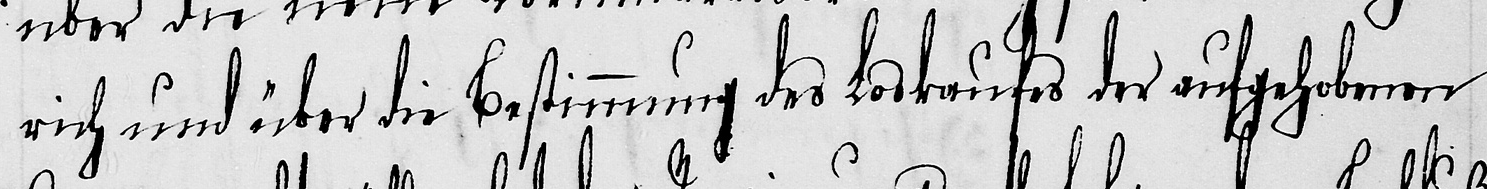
rich und über die Bestimmung des Loskaufes der aufgehobenen
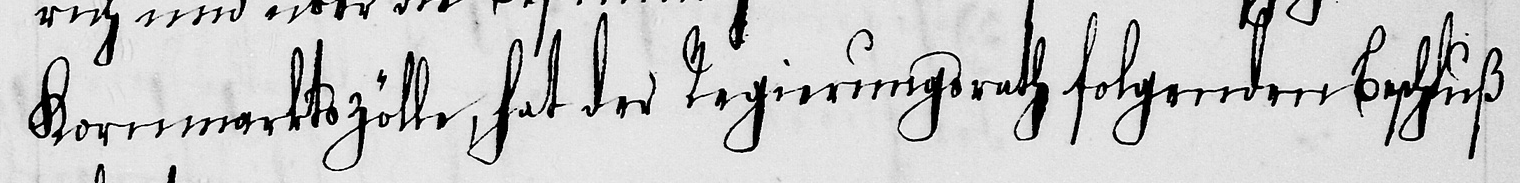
Kornmarktszölle, hat der Regierungsrath folgenden Beschluß
